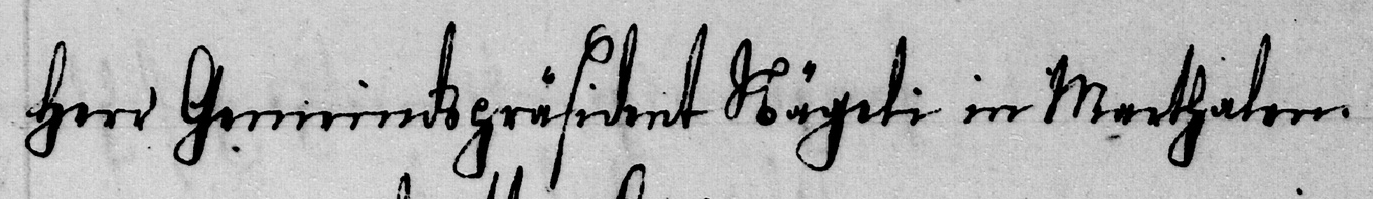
Herr Gemeindspräsident Nägeli in Marthalen.
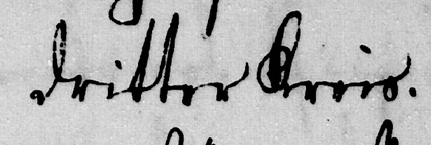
Dritter Kreis.
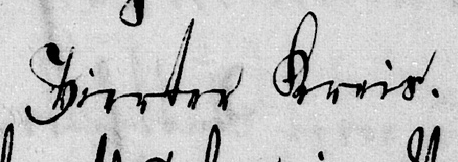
Vierter Kreis.
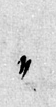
5.
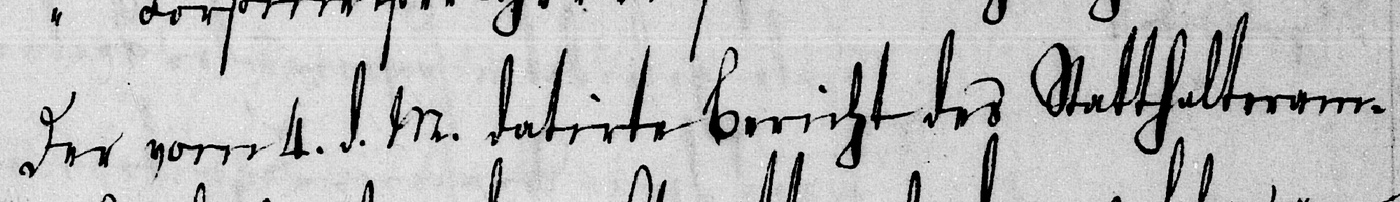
Der vom 4. d. M. datirte Bericht des Statthalteram¬
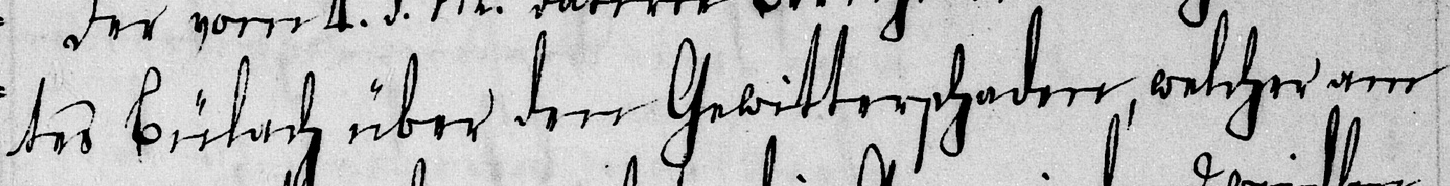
tes Bülach über den Gewitterschaden, welcher am
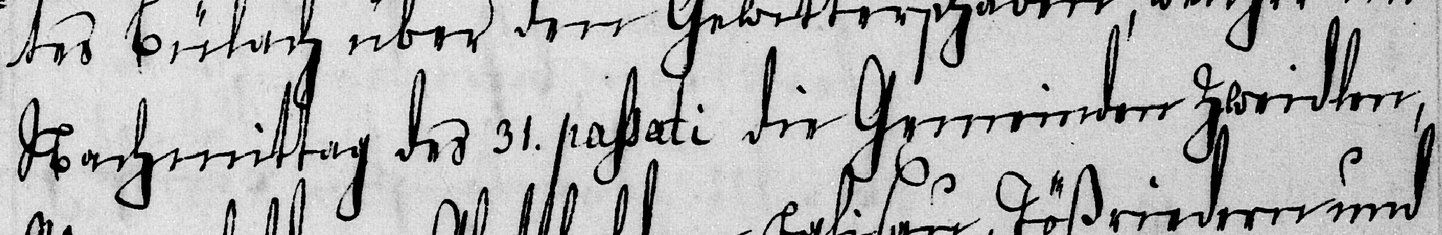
Nachmittag des 31. passati die Gemeinden Zweidlen,
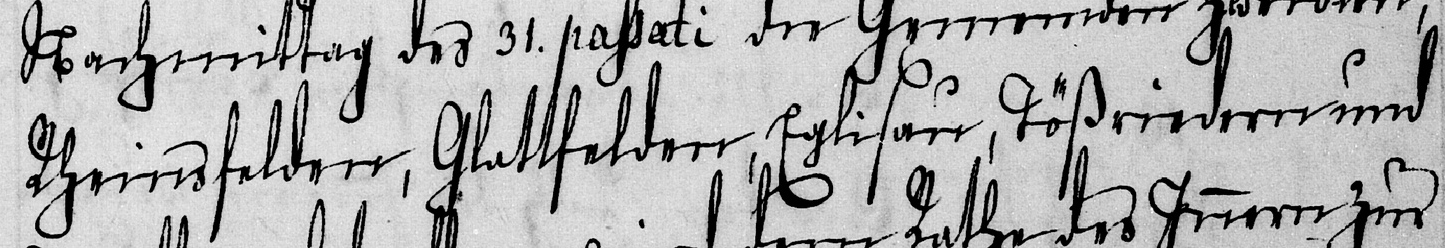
Rheinsfelden, Glattfelden, Eglisau, Tößriedern und
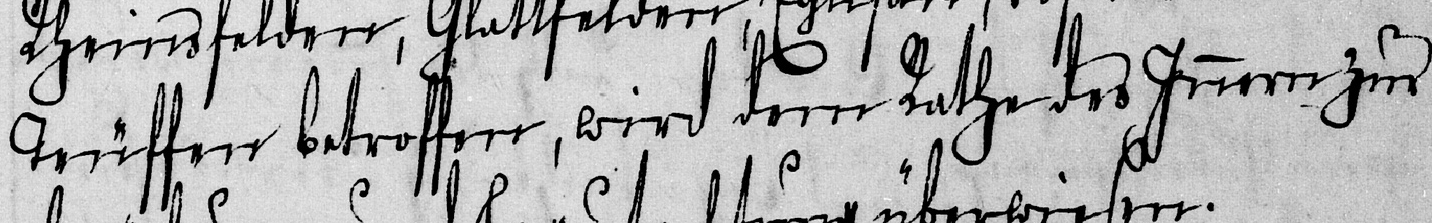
Teuffen betroffen, wird dem Rathe des Innern zur
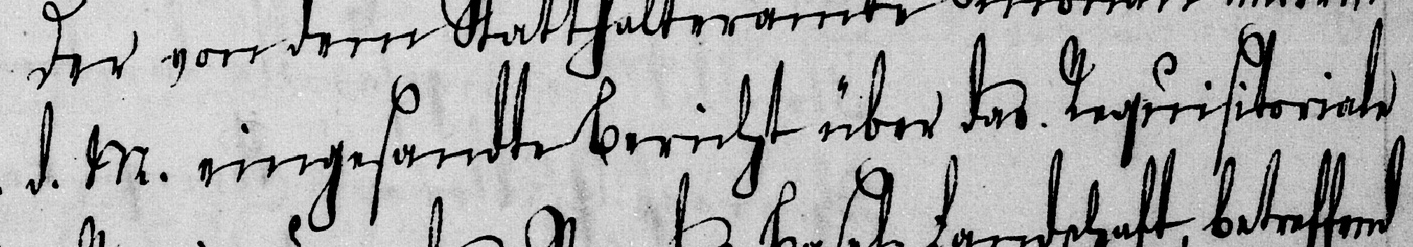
d. M. eingesandte Bericht über das Requisitoriale
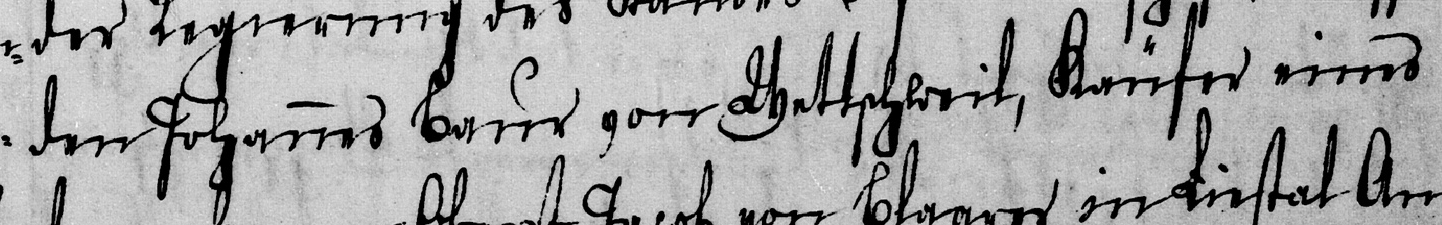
den Johannes Baur von Wettschweil, Käufer eines
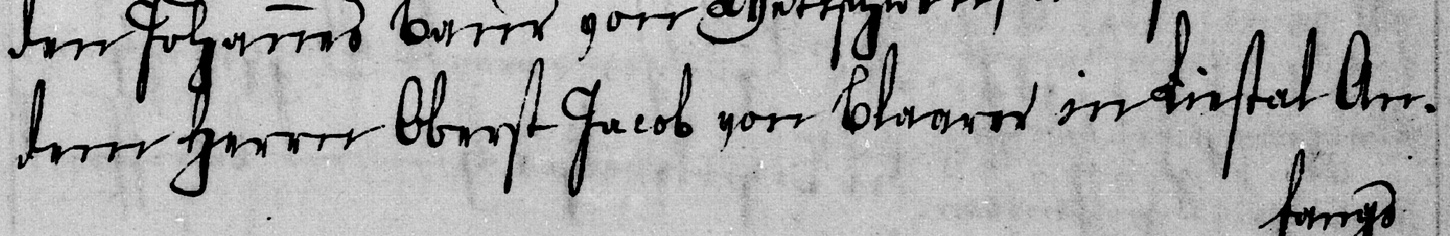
dem Herrn Oberst Jacob von Blaarer in Liestal An-
